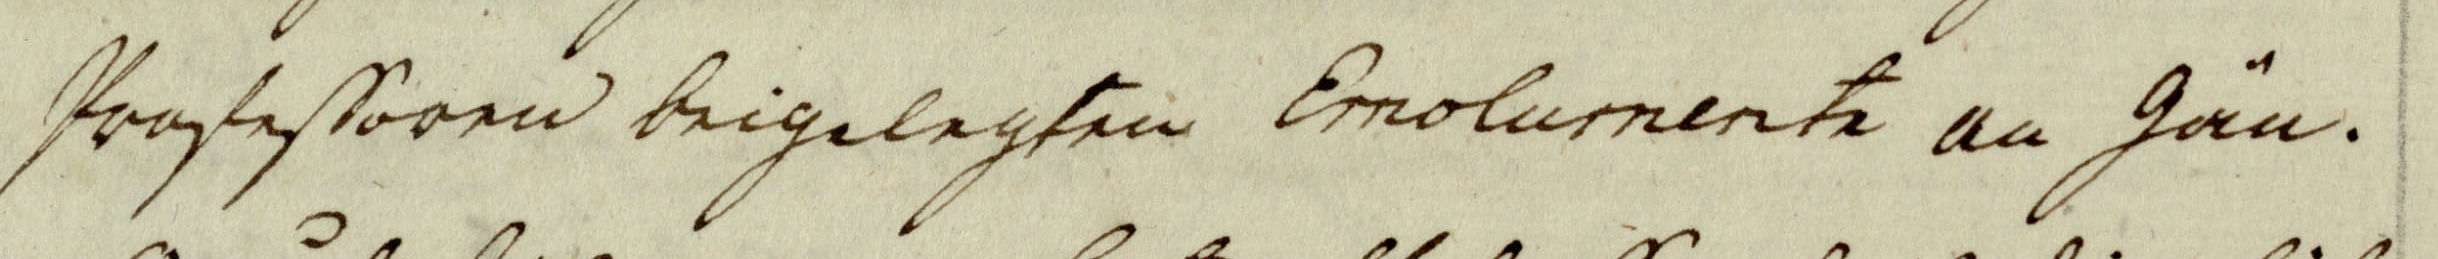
Professoren beigelegten Emolumente an Gän¬
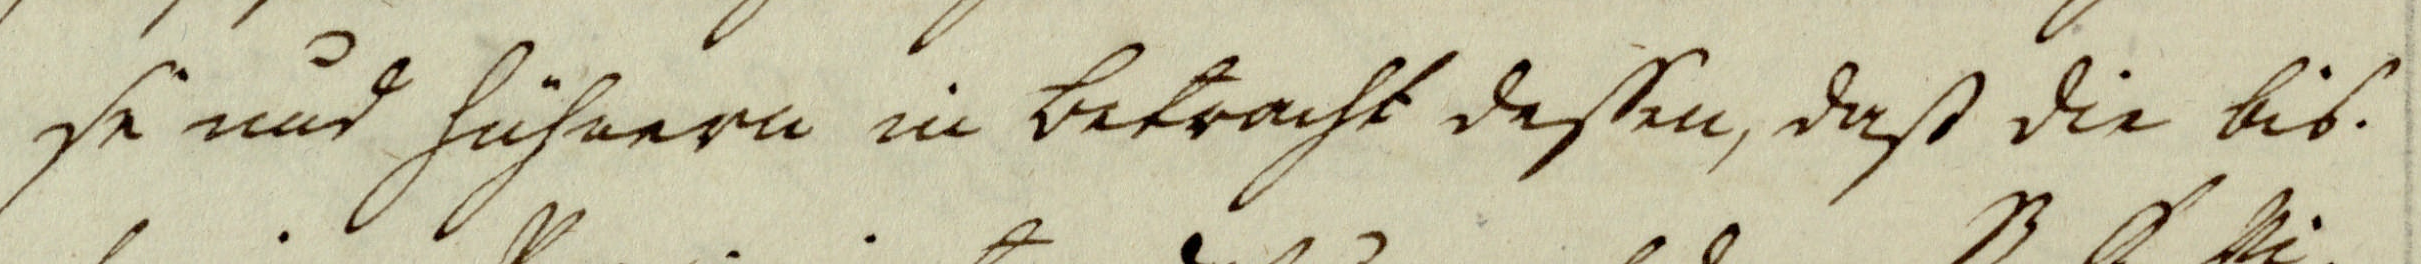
se und Hühnern in Betracht dessen, daß die bis¬
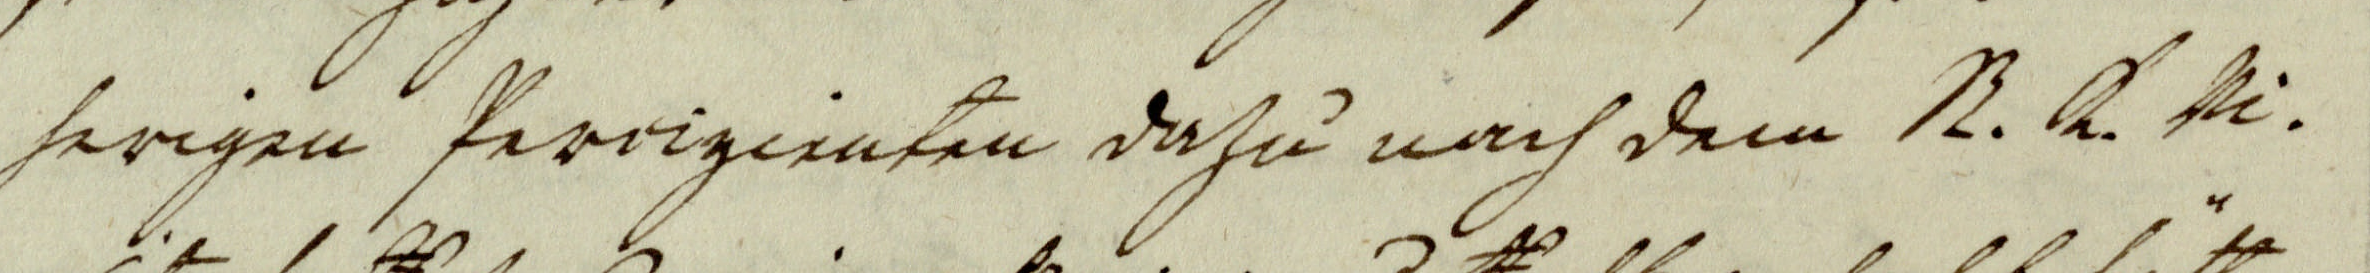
herigen Percipienten dazu nach dem N. L. Vi¬
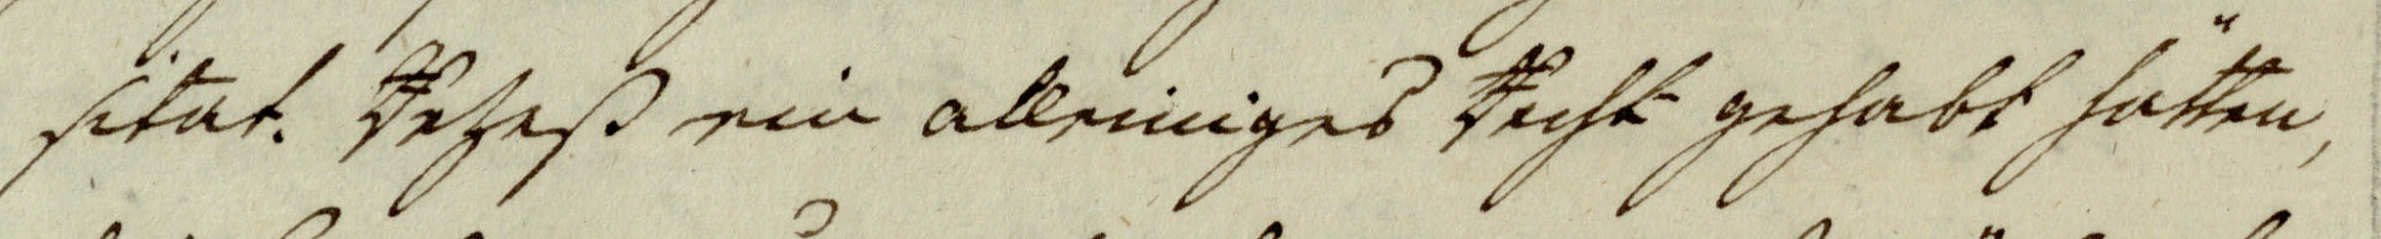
sitat. Receß ein alleiniges Recht gehabt hätten,
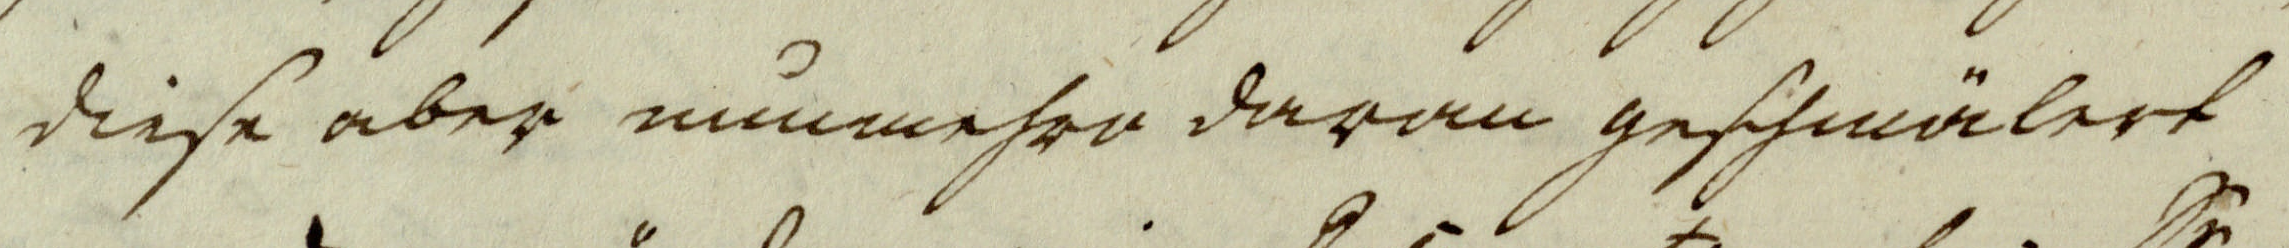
diese aber nunmehro daran geschmälert
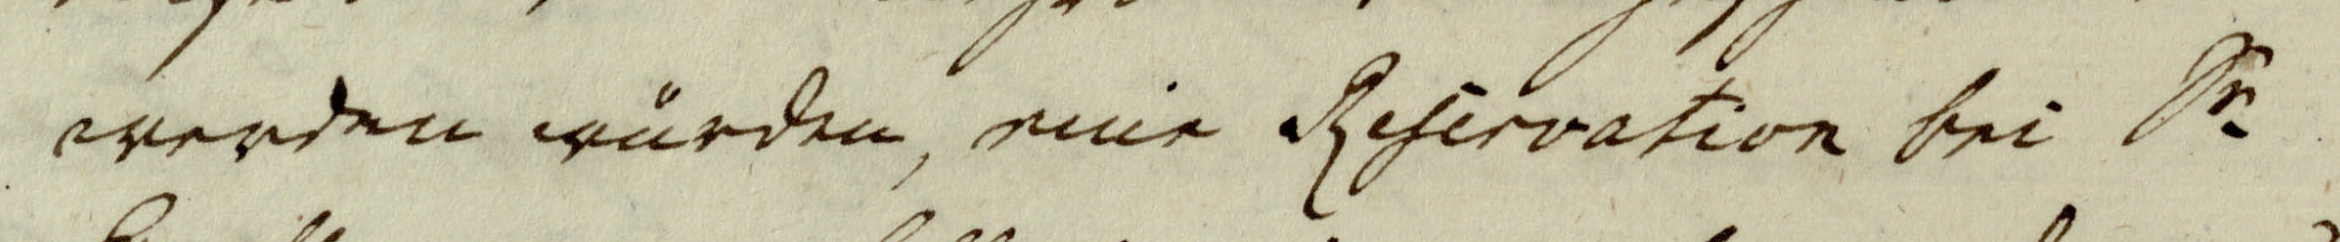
werden würden, eine Reservation bei Sr.
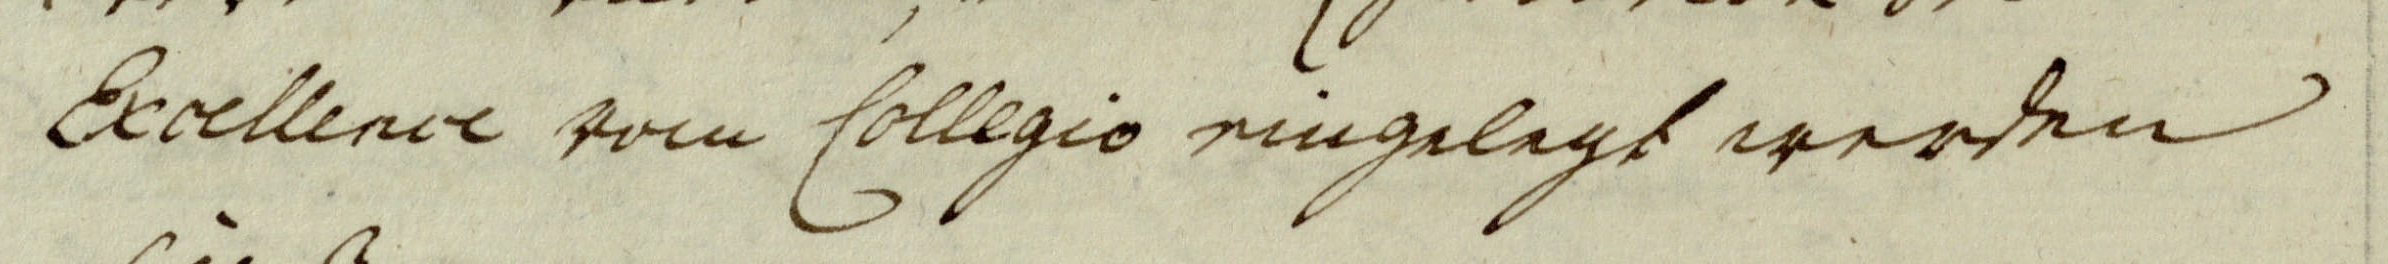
Excellence vom Collegio eingelegt werden
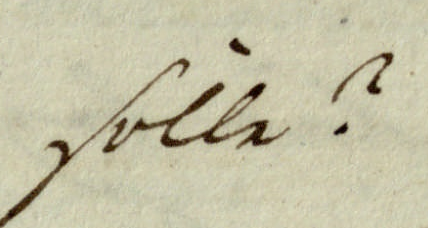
solle?
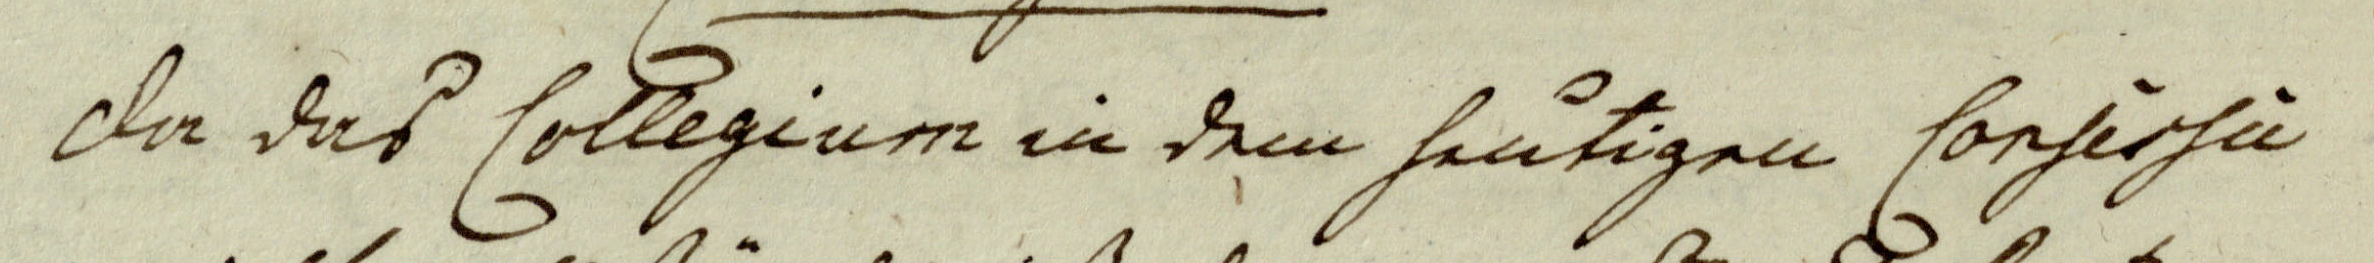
Da das Collegium in dem heutigen Consessu
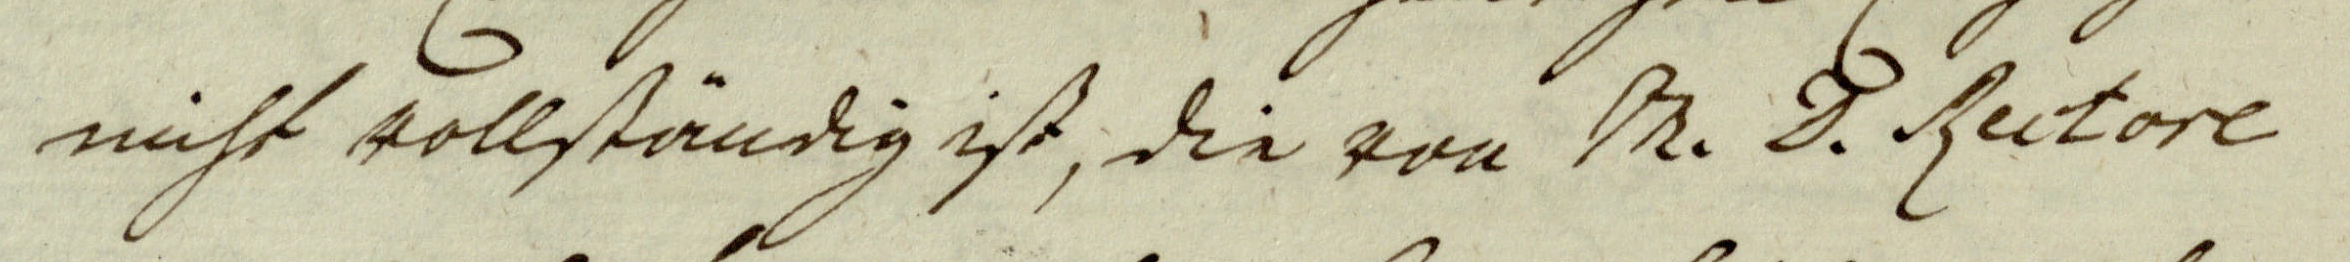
nicht vollständig ist, die von M. D. Rectore
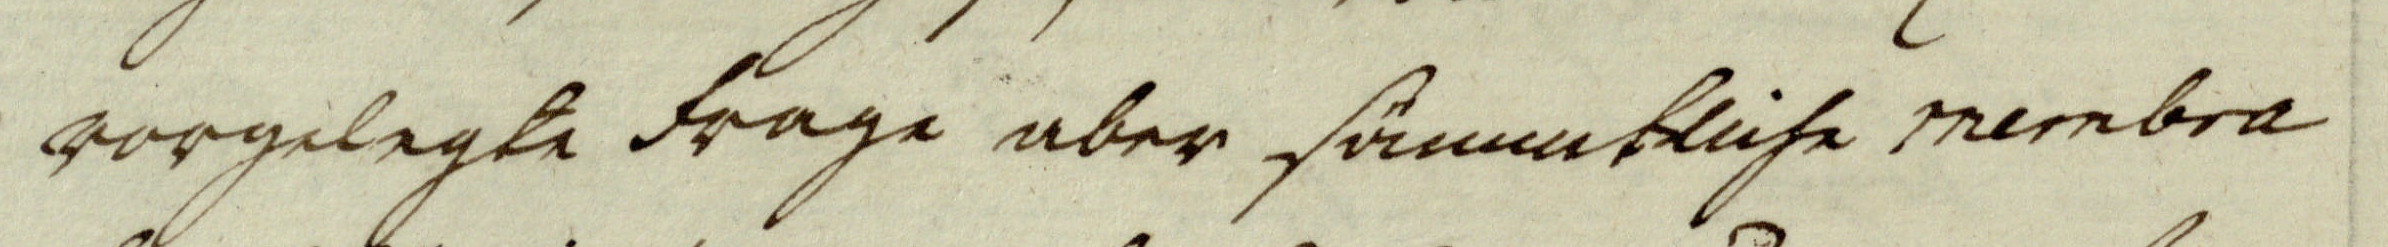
vorgelegte Frage aber sämmtliche membra
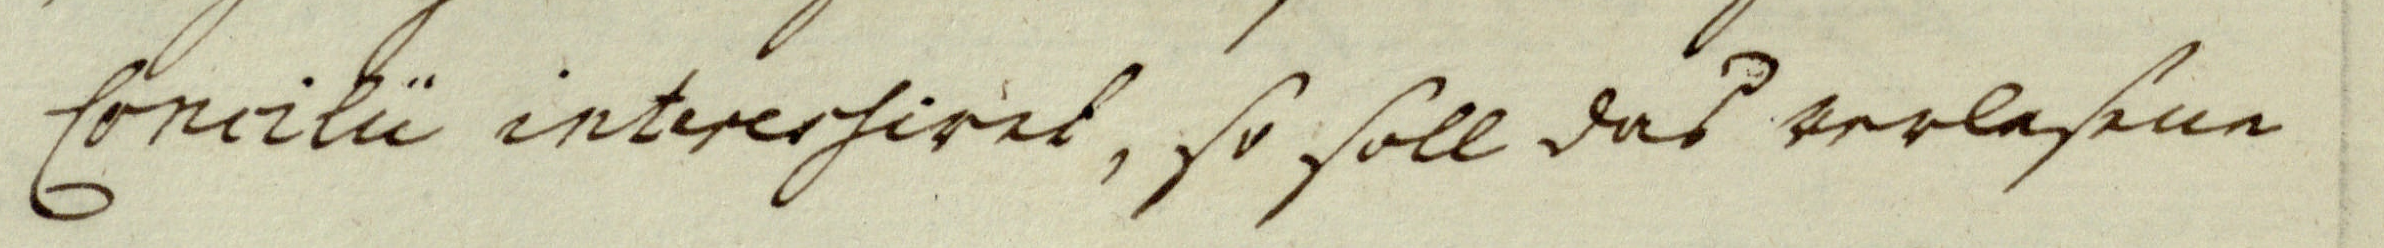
Concilii enteressiret, so soll das verlesene
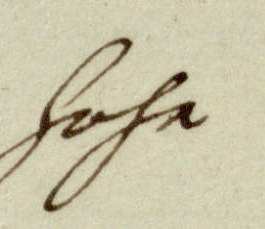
hohe
